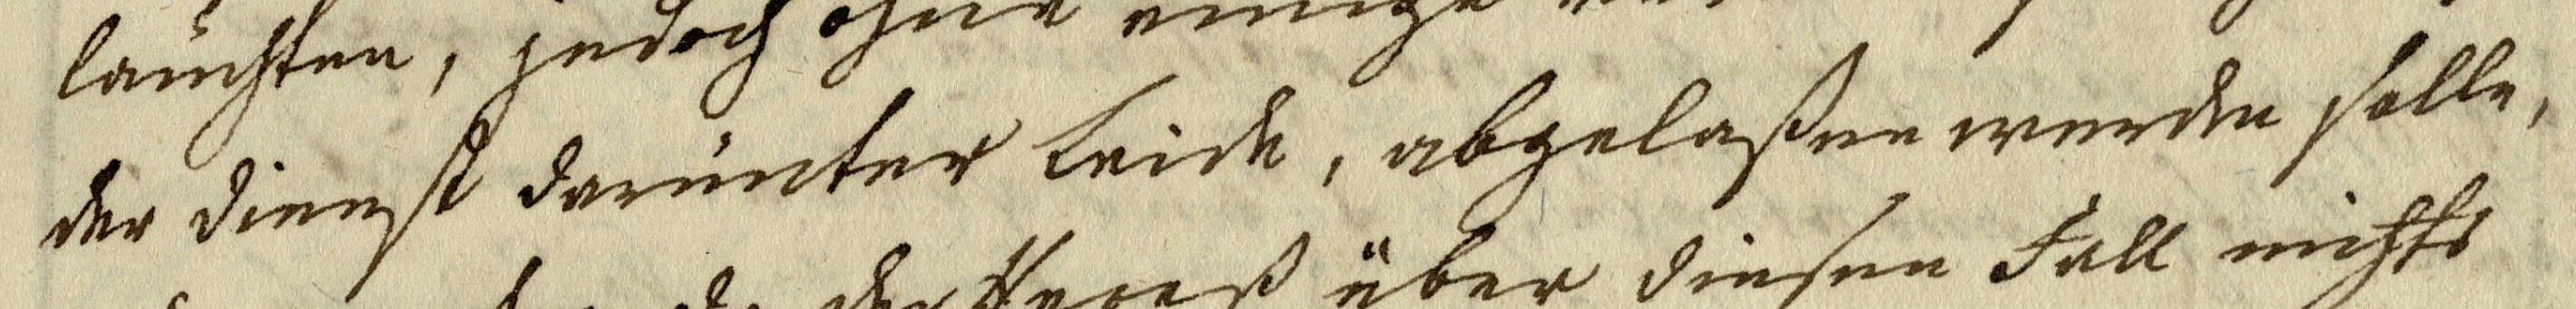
der Dienst darunter leide, abgelaßen werden solte,
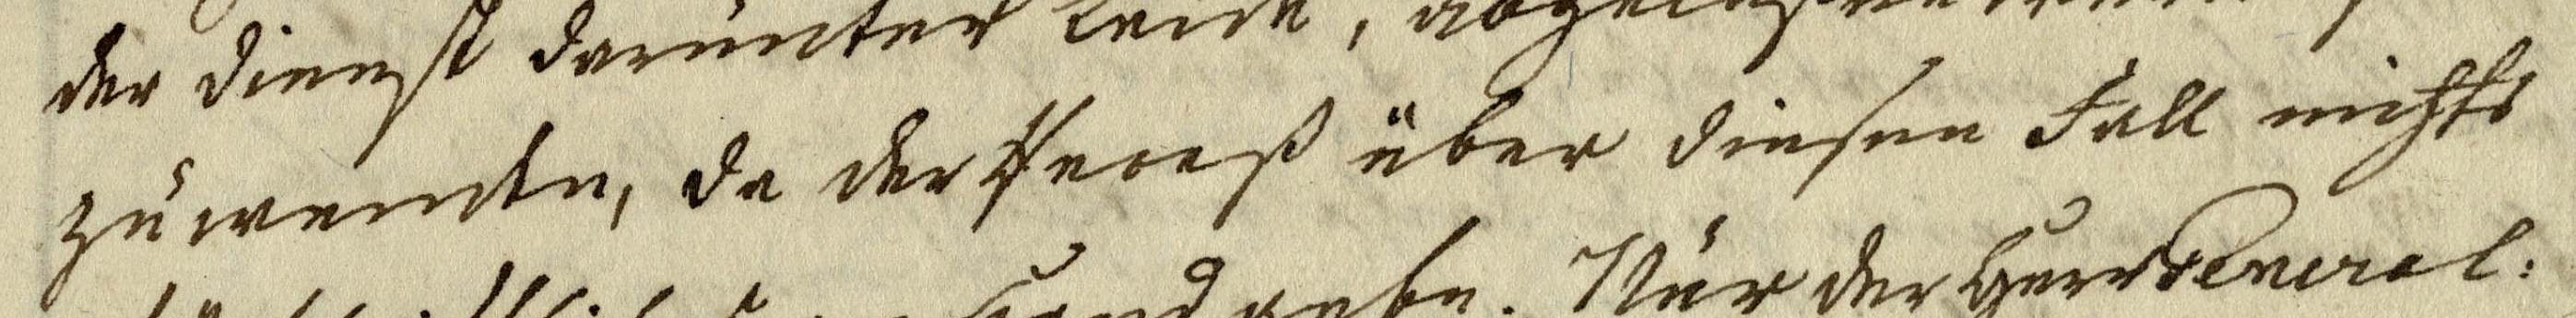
zu wenden, da der Receß über diesen Fall nichts
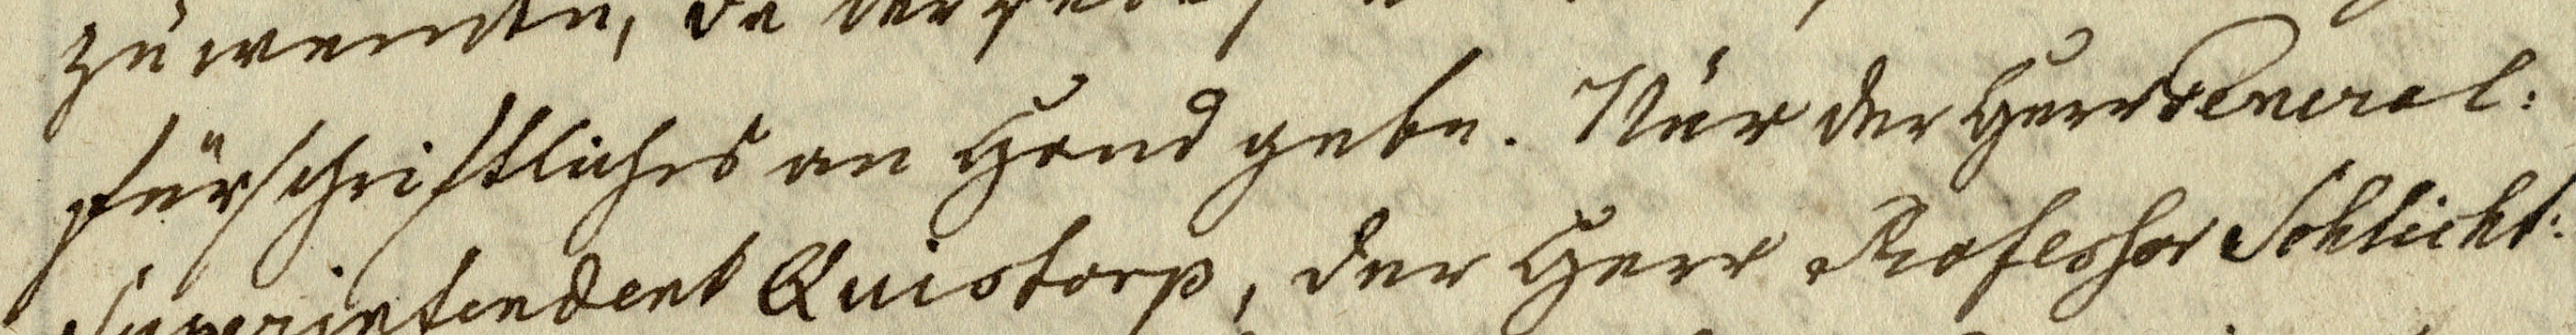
fürschriftliches an Hand gebe. Nur der Herr General¬
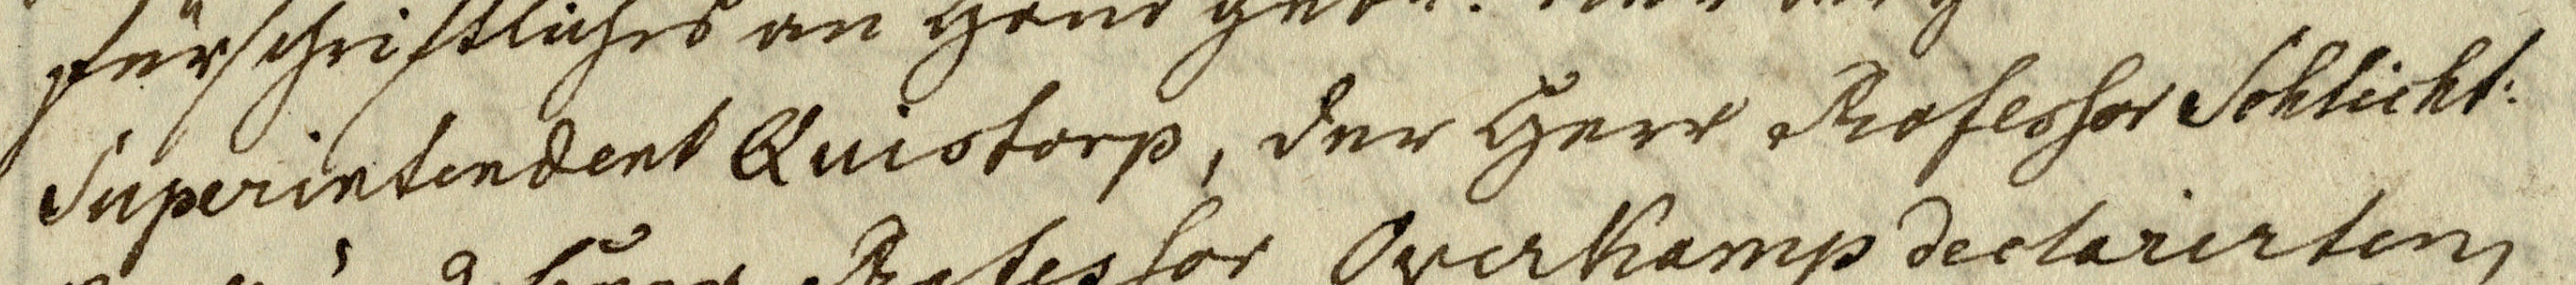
Superintendent Quistorp, der Herr Professor Schlicht¬
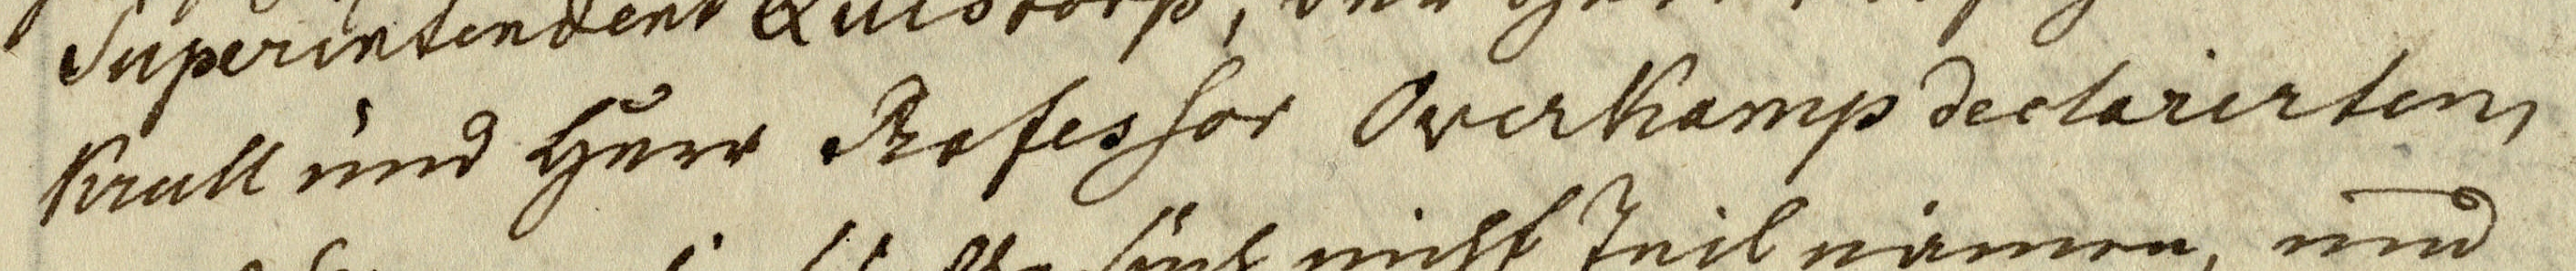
krull und Herr Professor Overkamp declarirten,
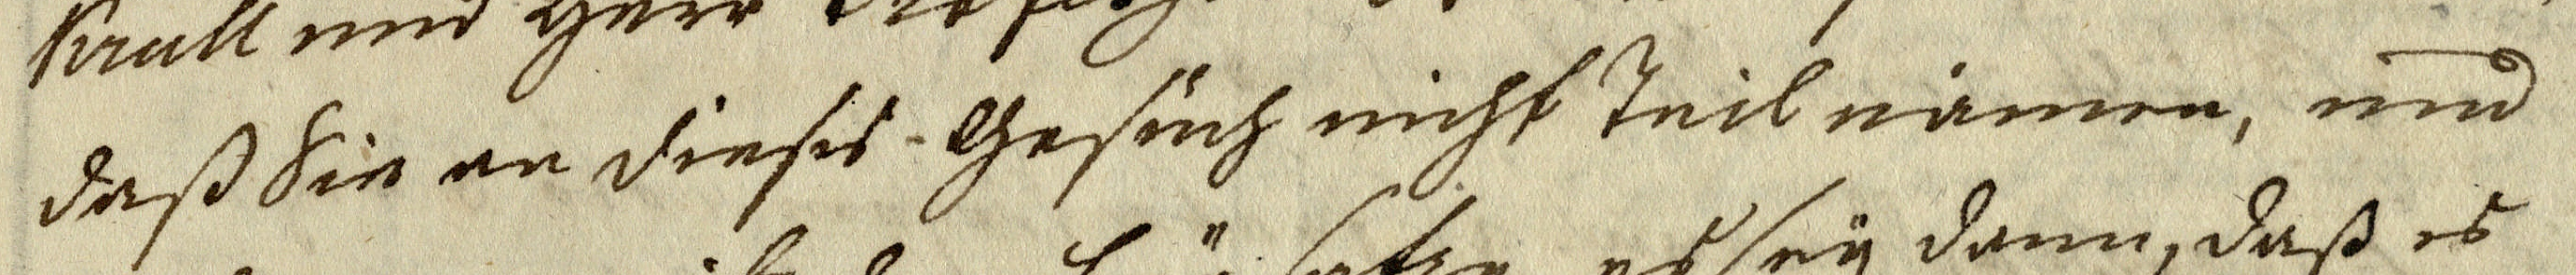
daß Sie an dieses Gesuch nicht Teil nämen, und
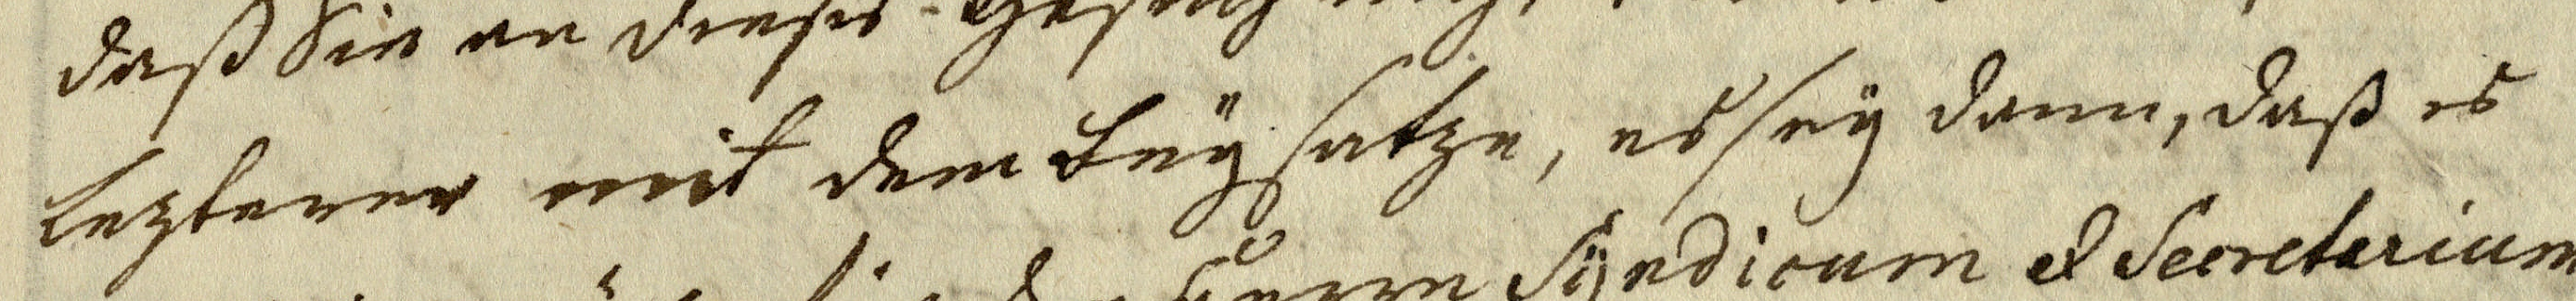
Lezterer mit dem Beÿsatze, es seÿ dann, daß es
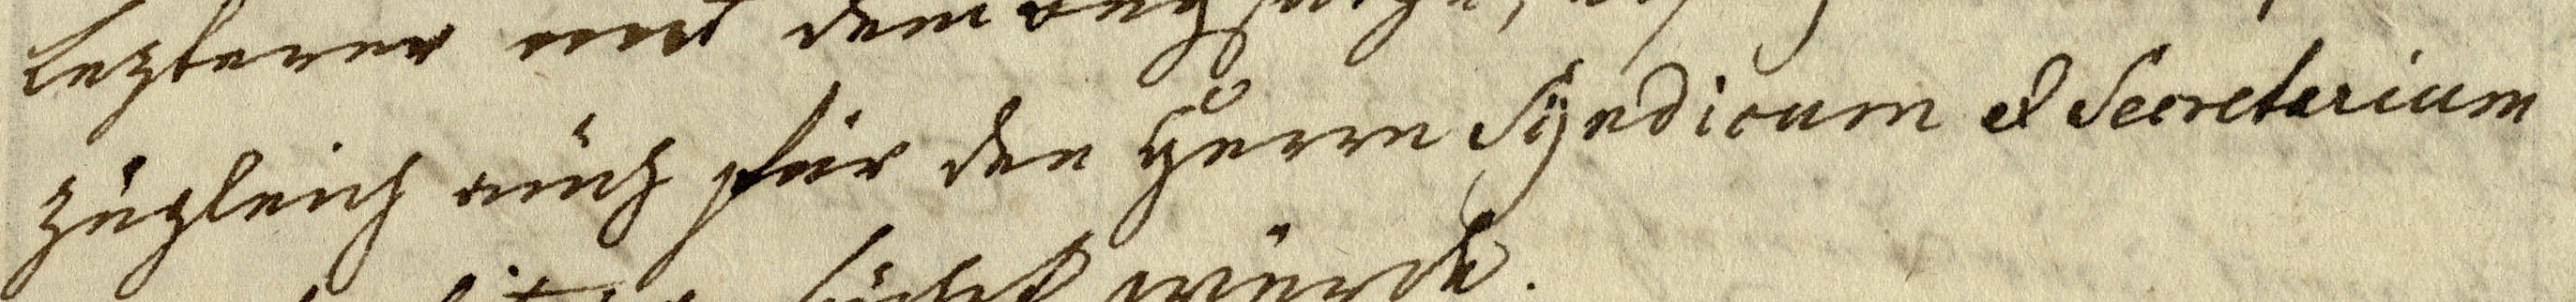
zugleich auch für den Herrn Sÿndicum ex Secretarium
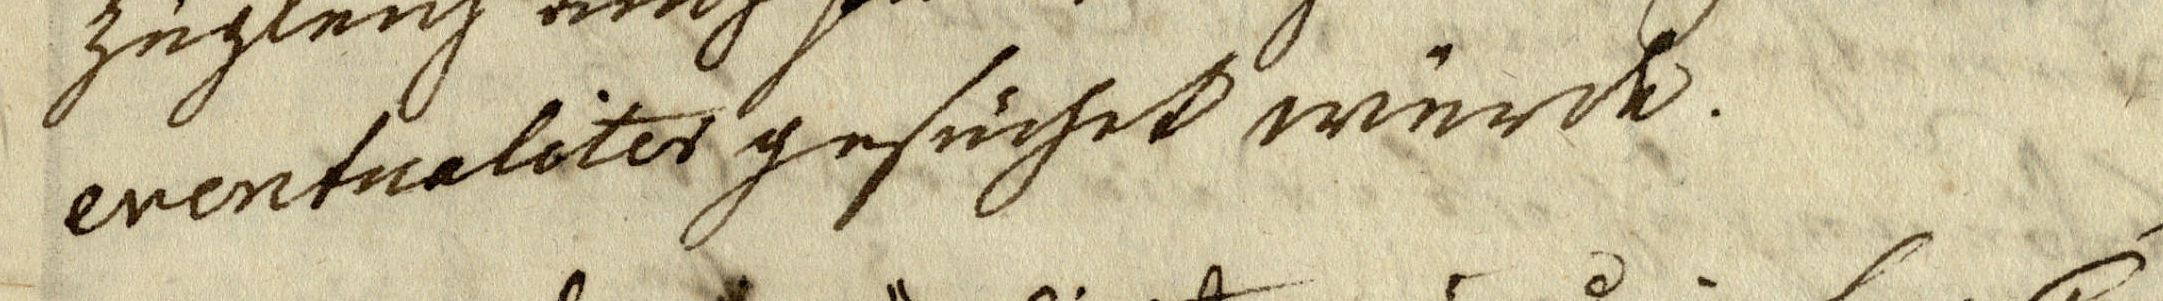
eventualiter gesuchet würde.
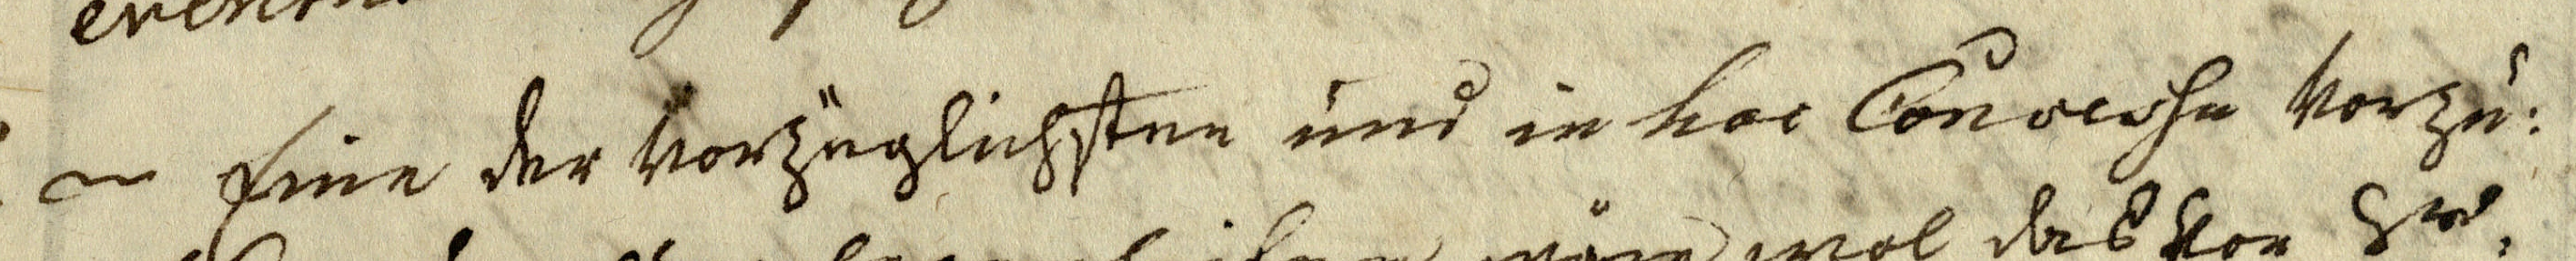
5. Eine der vorzüglichsten und in hoc Consessu vorzu¬
